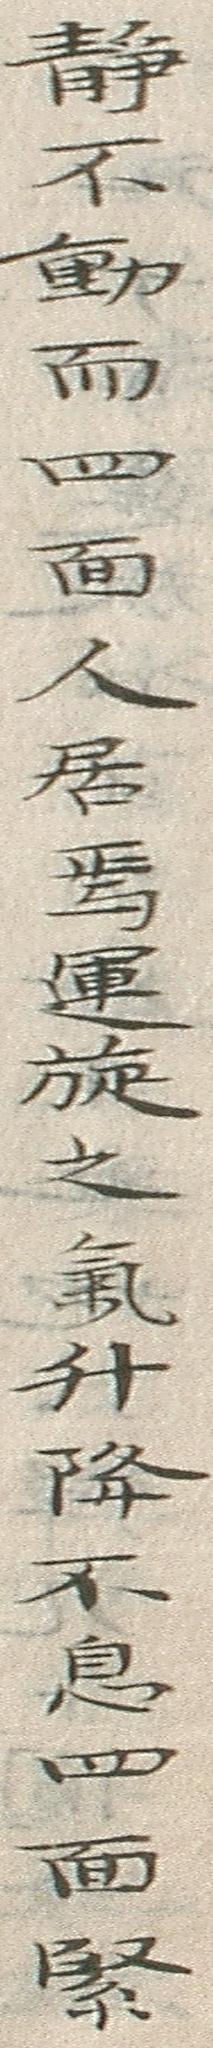静不動而四面人居焉運旋之気昇降不息四面緊
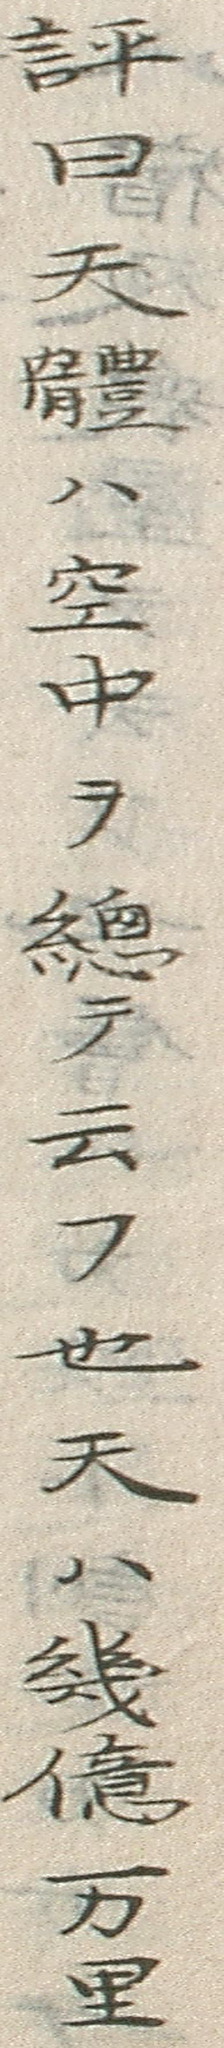評曰天体ハ空中ヲ総テ云フ也天ハ幾億万里
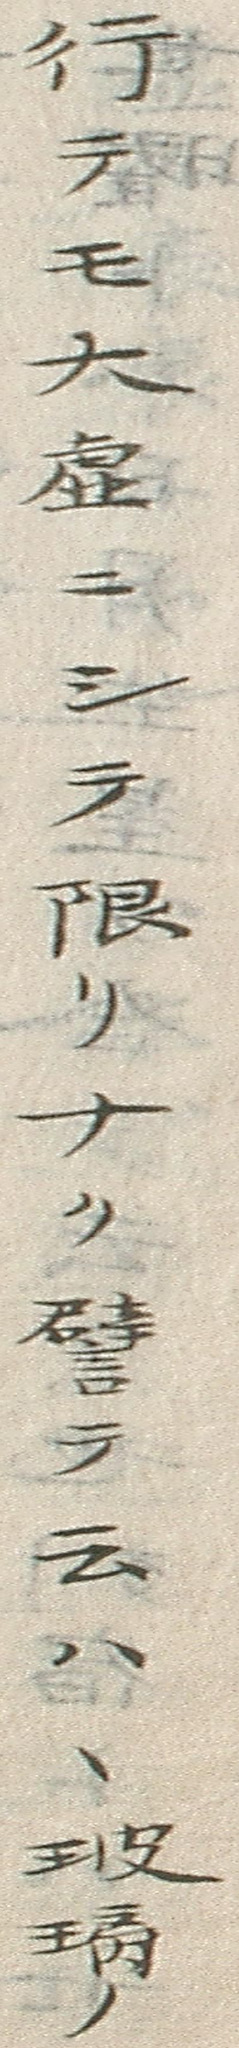行テモ大虚ニシテ限リナク譬テ云ハヽ玻璃ノ
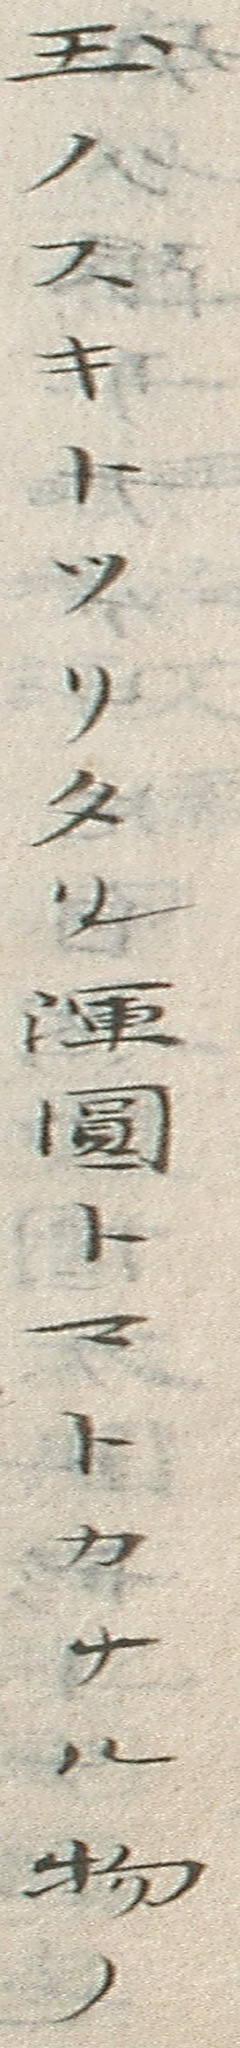玉ノスキトッリタル渾円トマトカナル物ノ

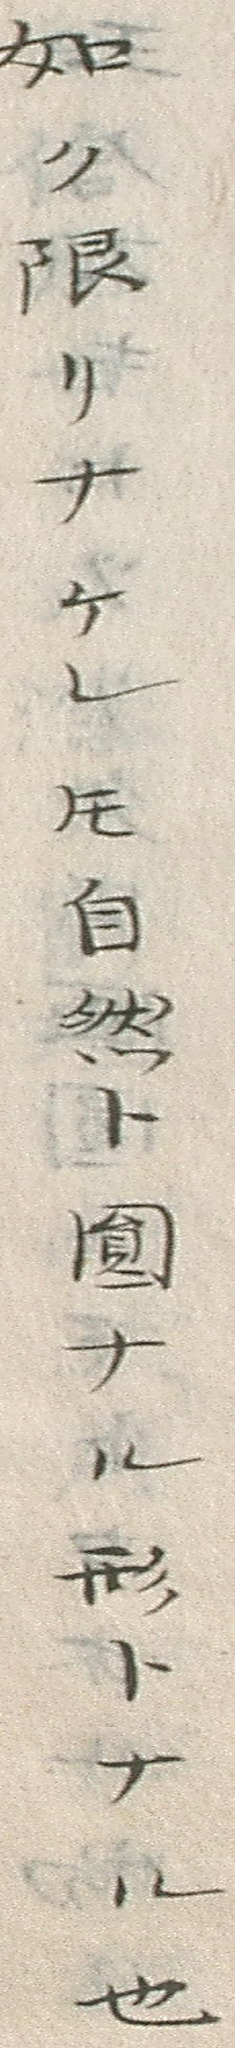如ク限リナケレトモ自然ト円ナル形トナル也
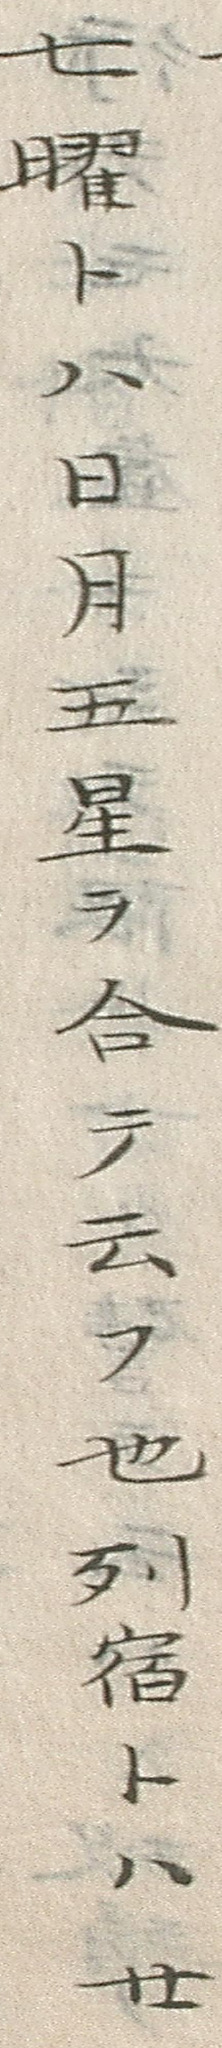七曜トハ日月五星ヲ合テ云フ也列宿トハ廿
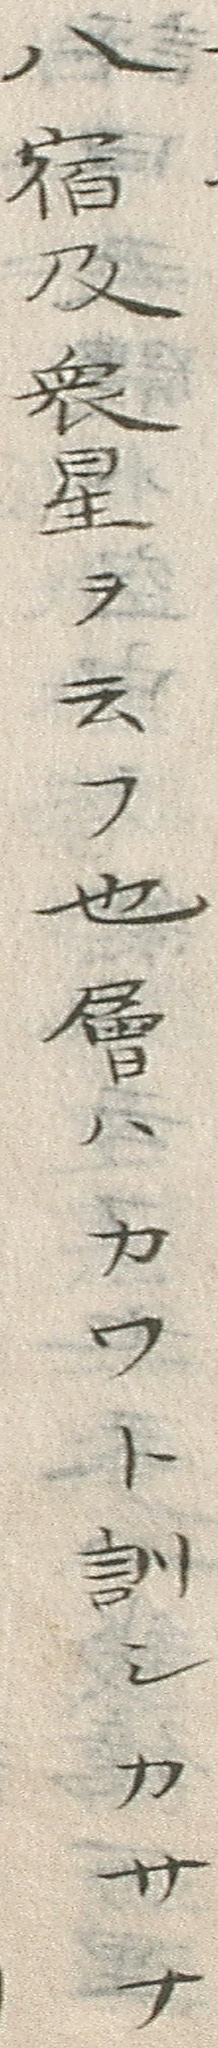八宿及衆星ヲ云フ也層ハカワト訓シカサナ
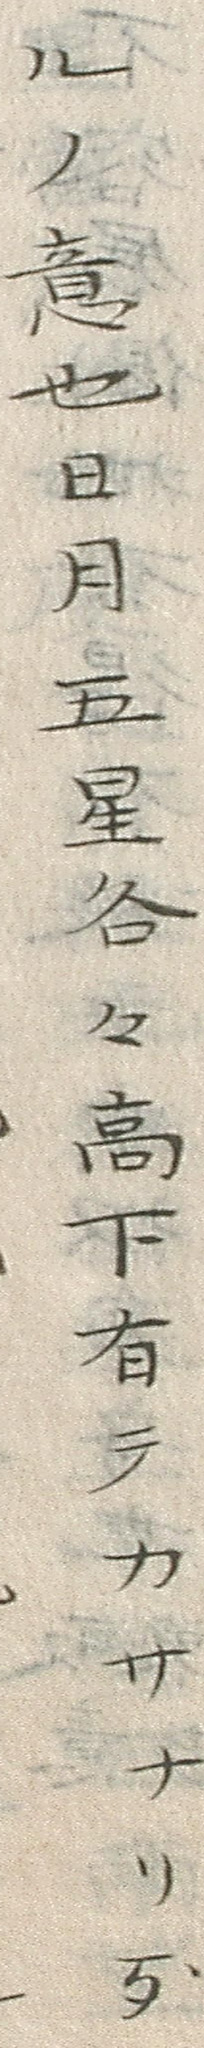ルノ意也日月五星各々高下有テカサナリ列
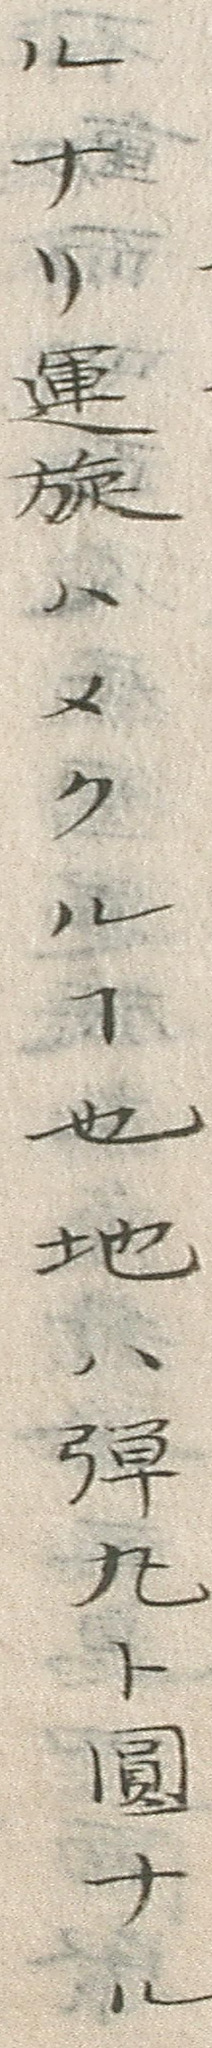ルナリ運旋ハメクルコト也地ハ弾丸ト円サル
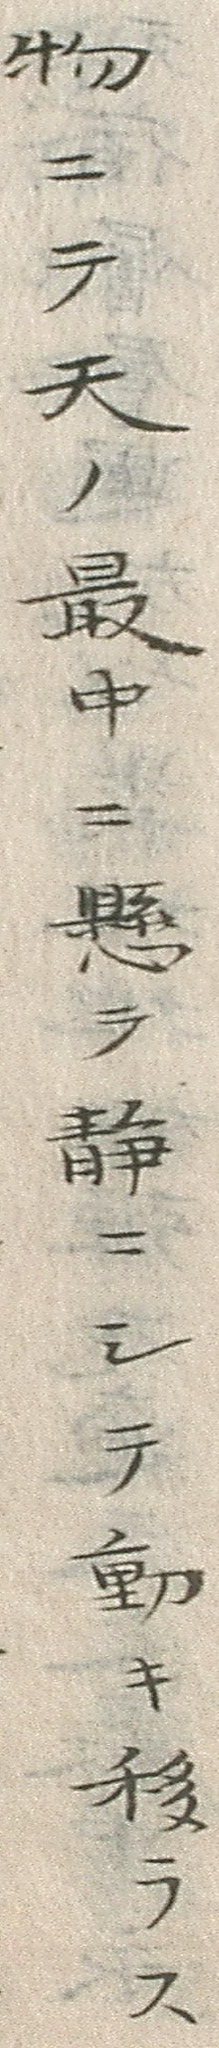物ニテ天ノ最中ニ懸ラ静ニシテ動キ移ラス
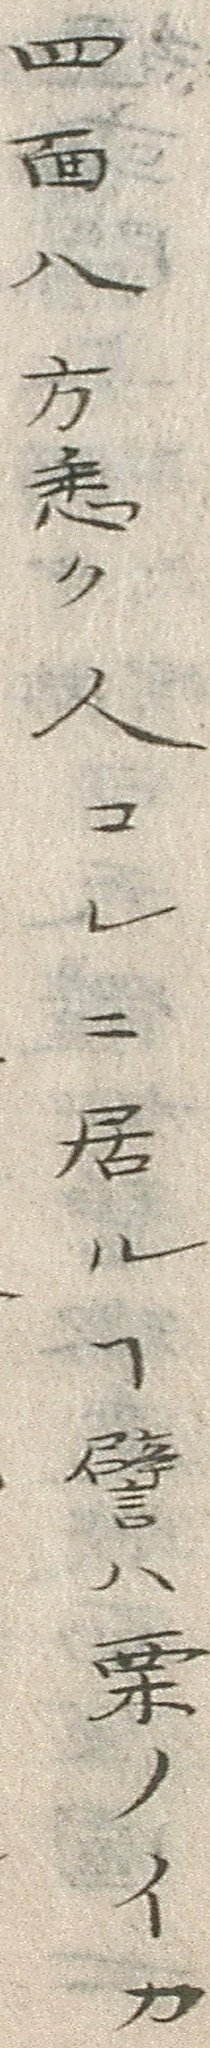四面八方悉ク人コレニ居ルコト譬ハ栗ノイカ
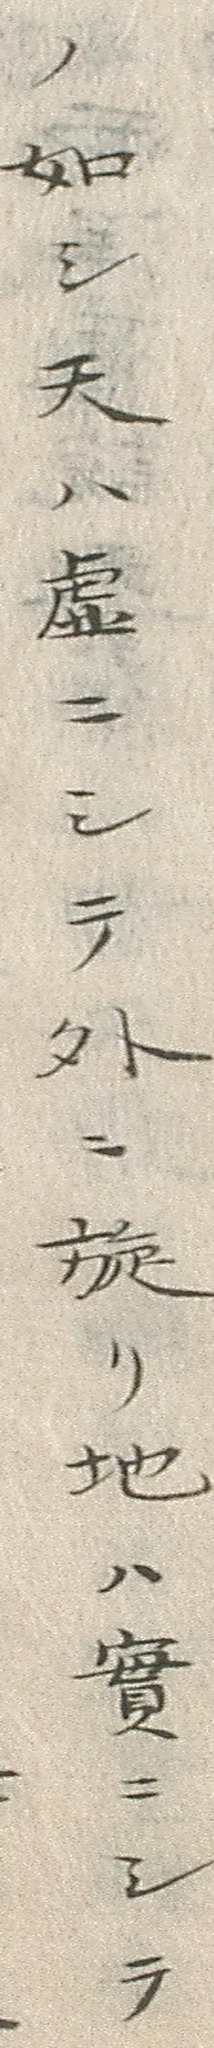ノ如シ天ハ虚ニシテ外ニ旋リ地ハ実ニシテ
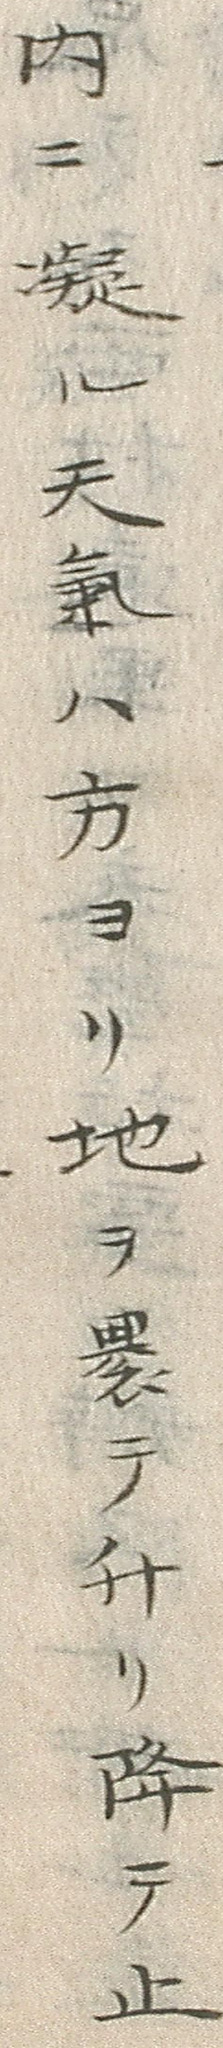内ニ凝ル天気ハ方ヨリ地ヲ褁テ昇リ降テ止
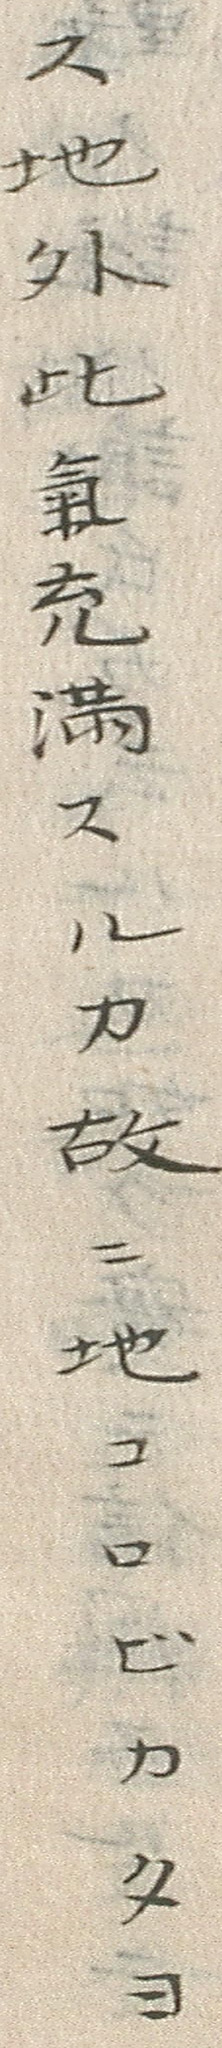ス地外此気充満スルカ故ニ地コロビカタヨ
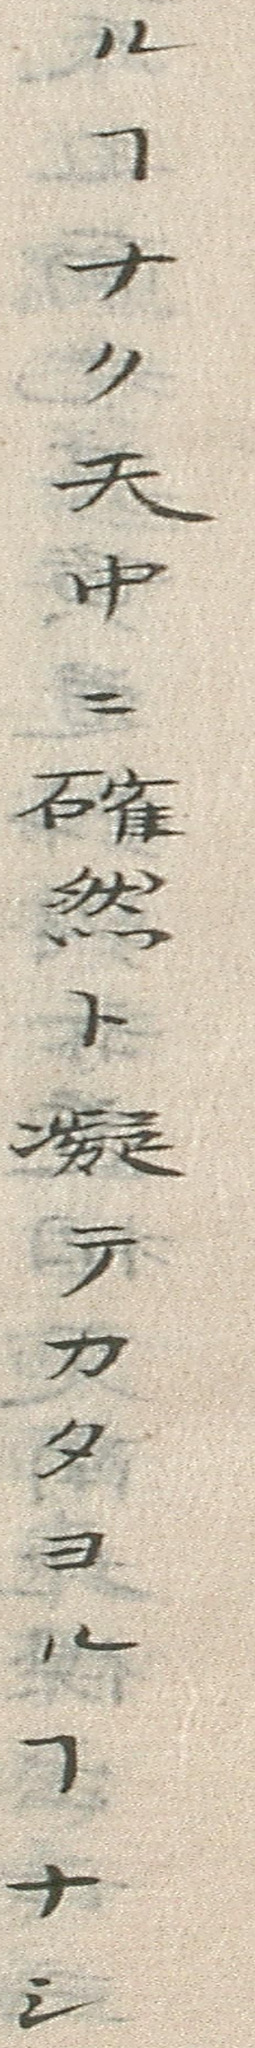ルコトナク天中ニ確然ト凝テカタヨルコトナシ
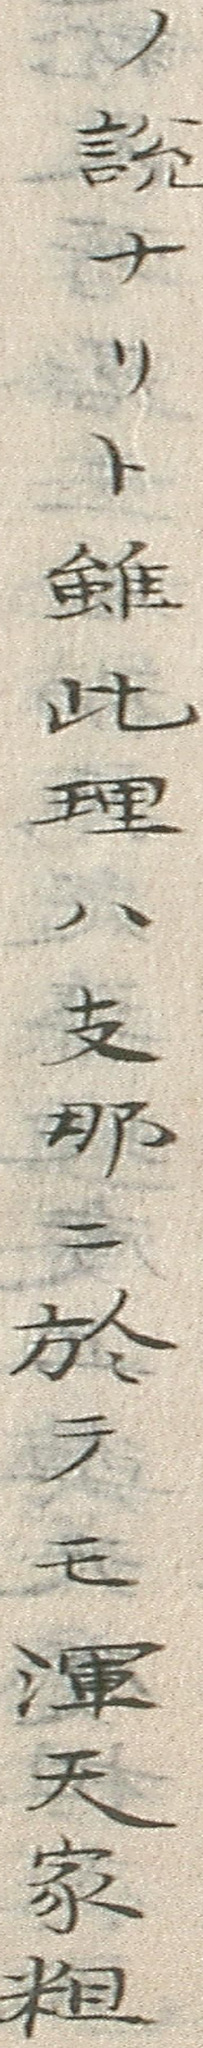ノ説ナリト雖此理ハ支那ニ於テモ渾天家粗
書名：天學略名目羽翼　全
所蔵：東京大学地震研究所図書室 Earthquake Research Institute Library, The University of Tokyo, JAPAN
